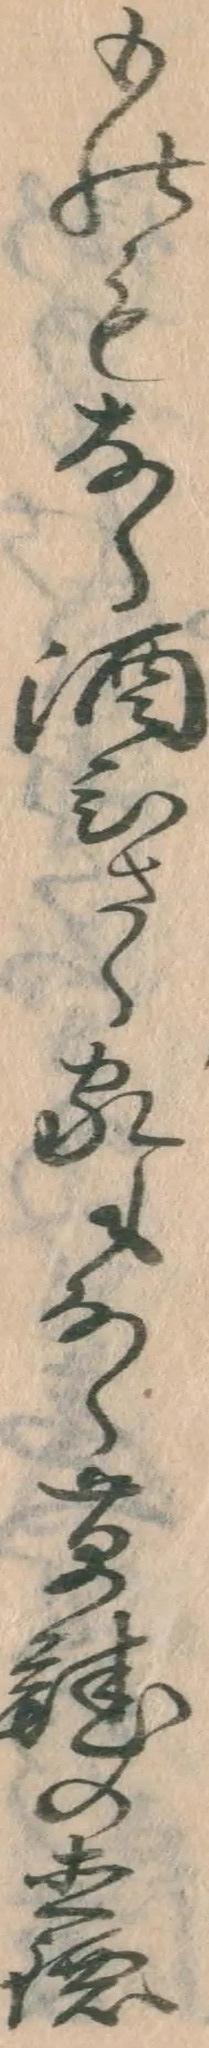ものもなく酒ひさく家もなく草鞋の直鐚
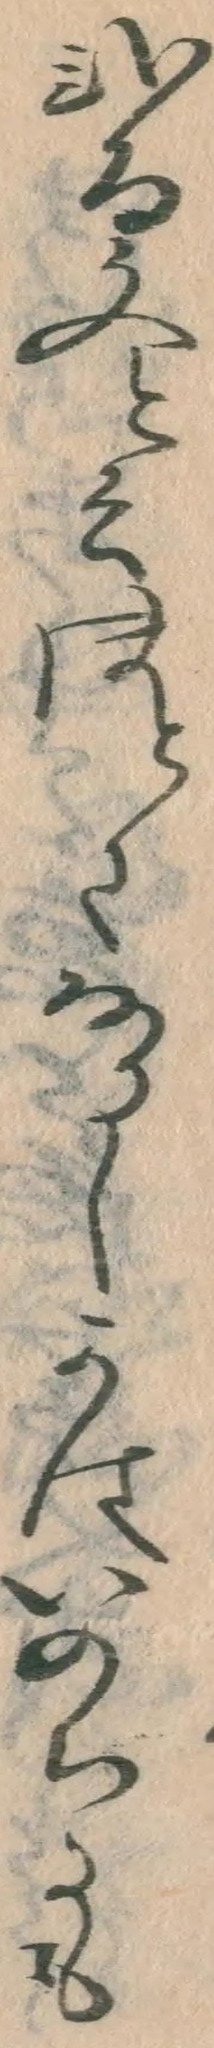弐百文と云ほとになりしかはいのちにも
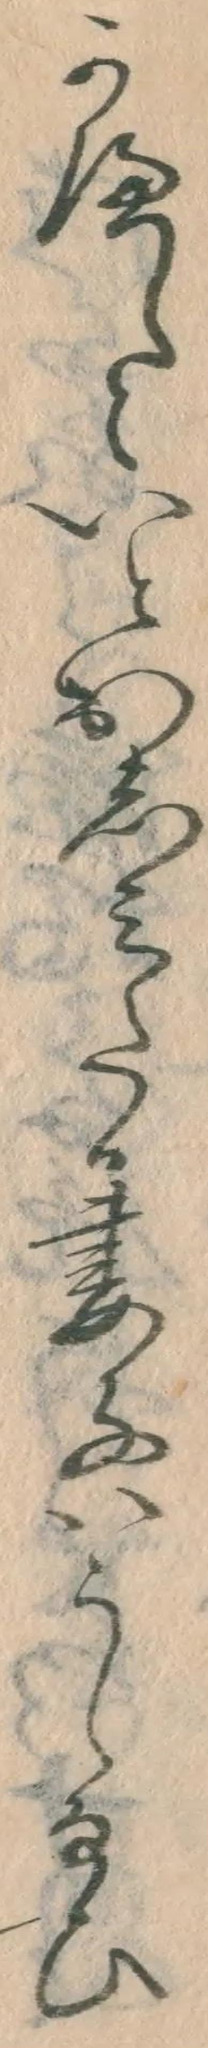かへしといとおしミたる妻子ハうしなひ
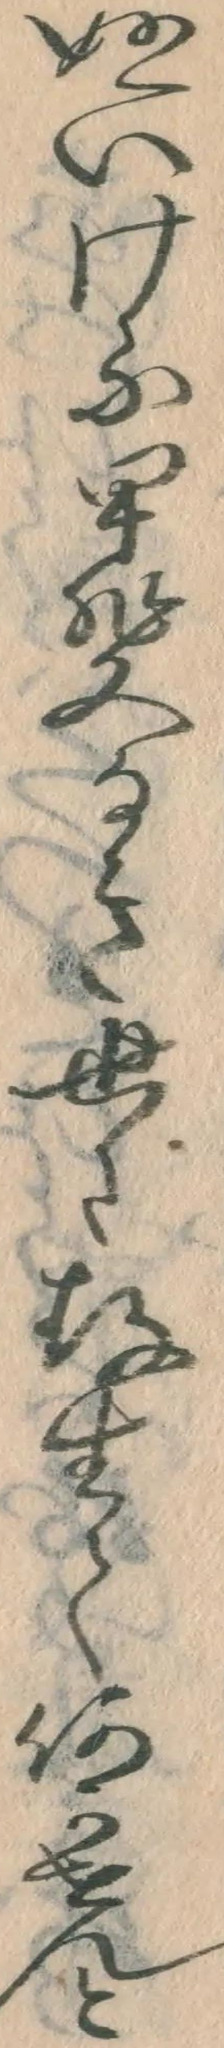ぬいける甲斐なき世に存生て何かせんと
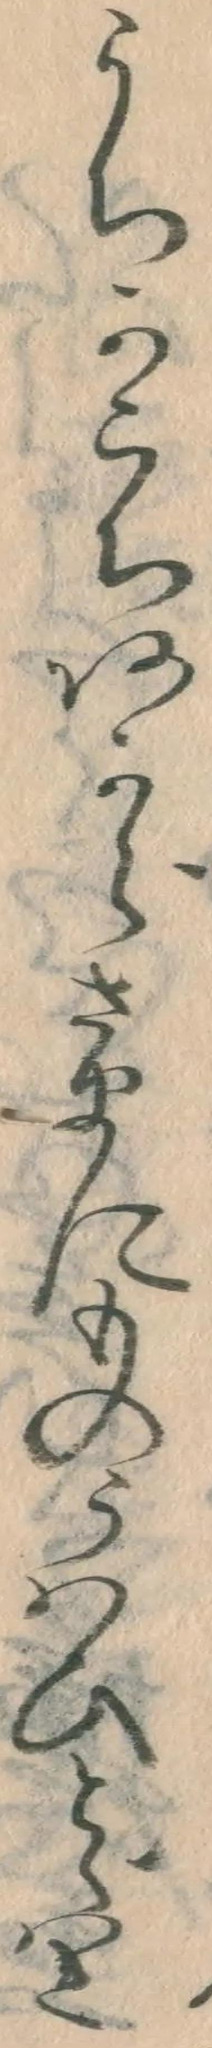うちかこちあからさまにものうハひとらハれ
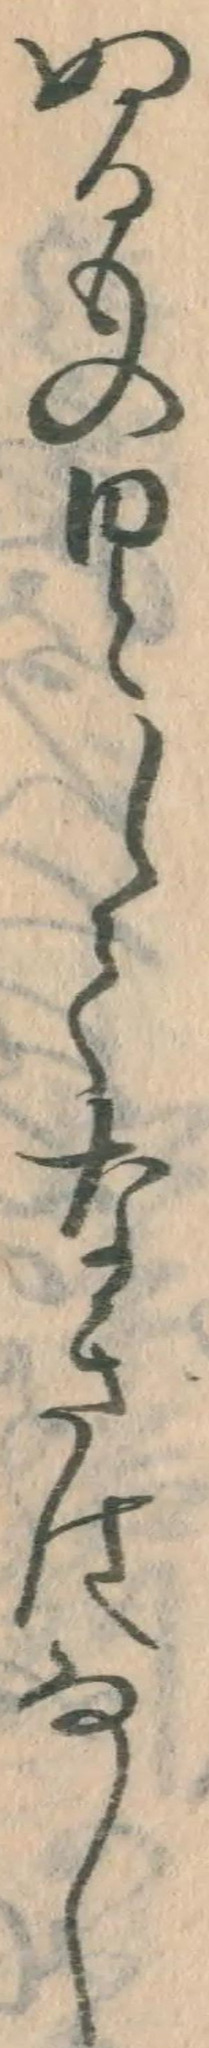ぬるもの日々してなきはなし

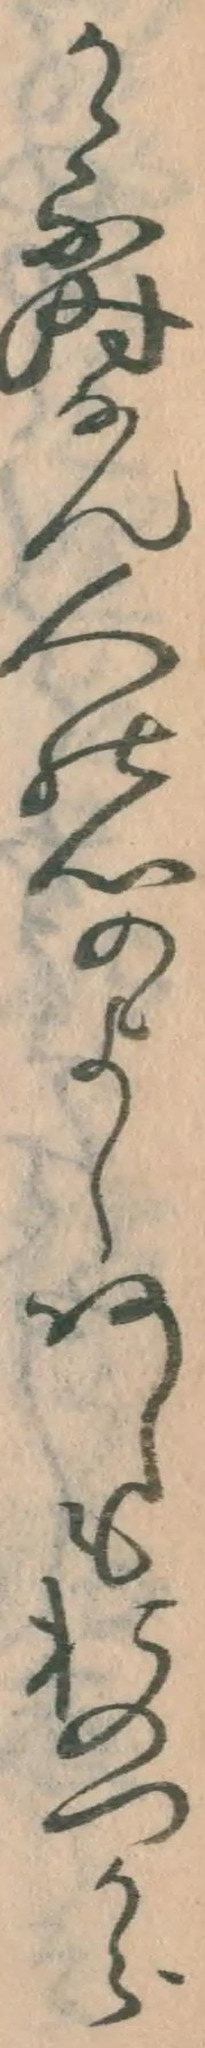かゝる時なん人の心のよしあしもおのつから
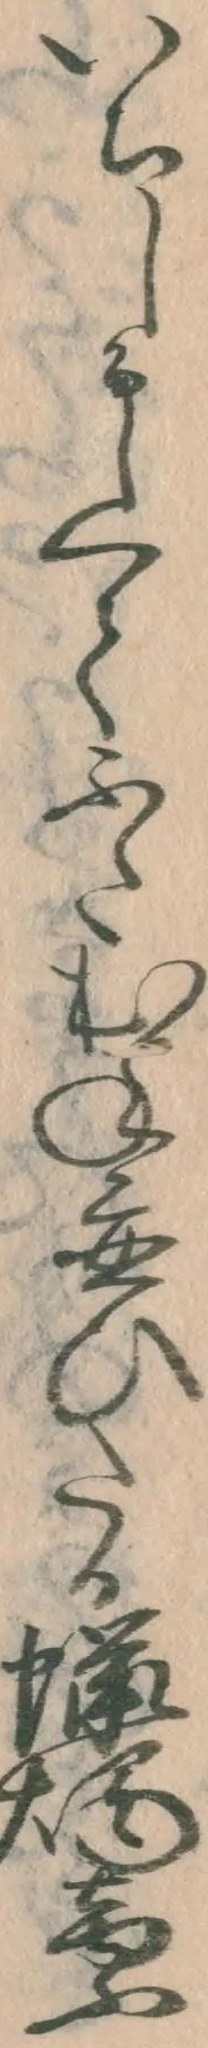いちしるしくてふたむね並ひたる蠟燭商ふ
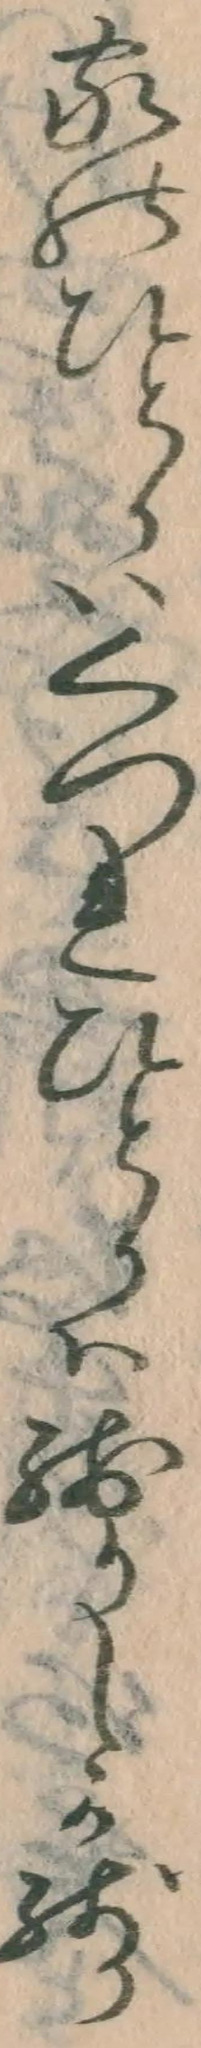家のひとりハくつれひとりハ残りしか残り
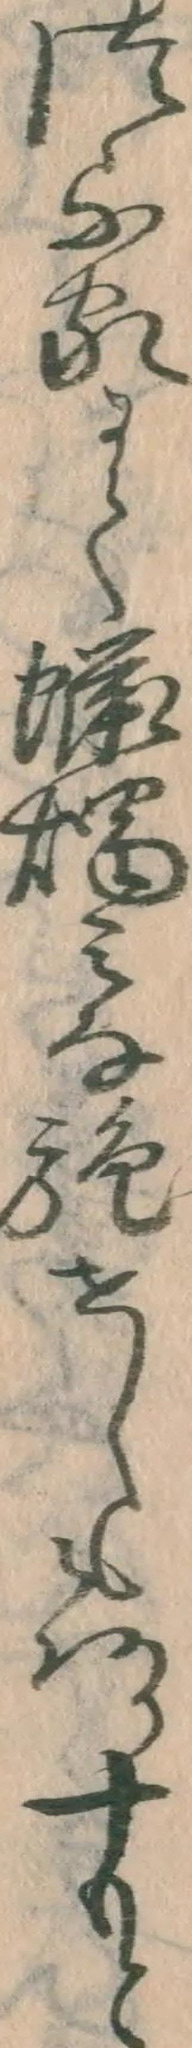つる家にて蠟燭ミな施せしもあり十もと
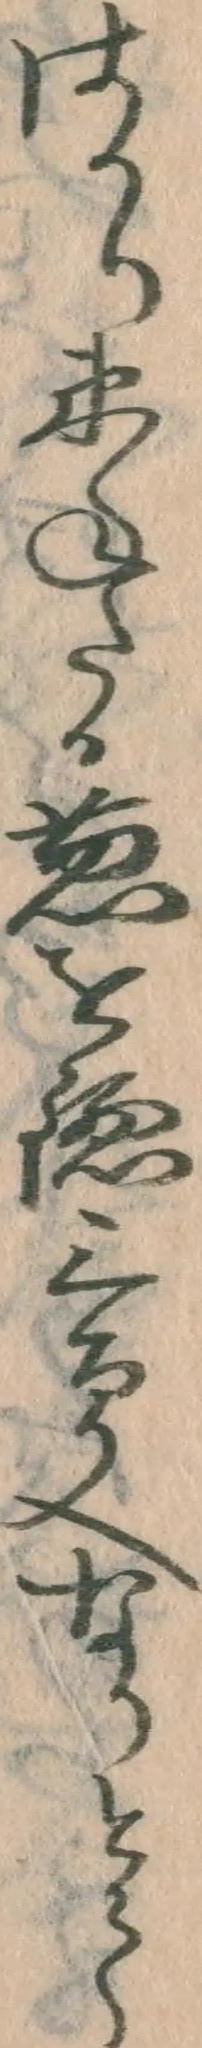はかり束ねたる葱を鐚三百文なりとて
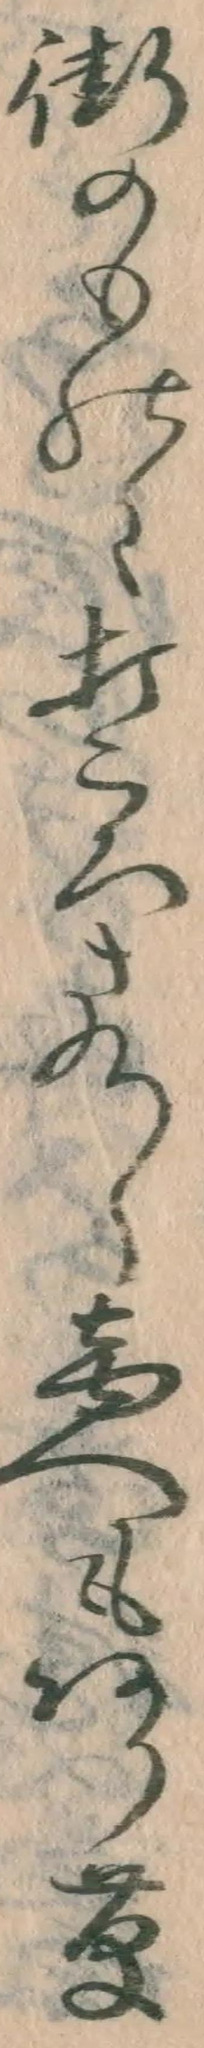街のものに打ころされし商人もあり草
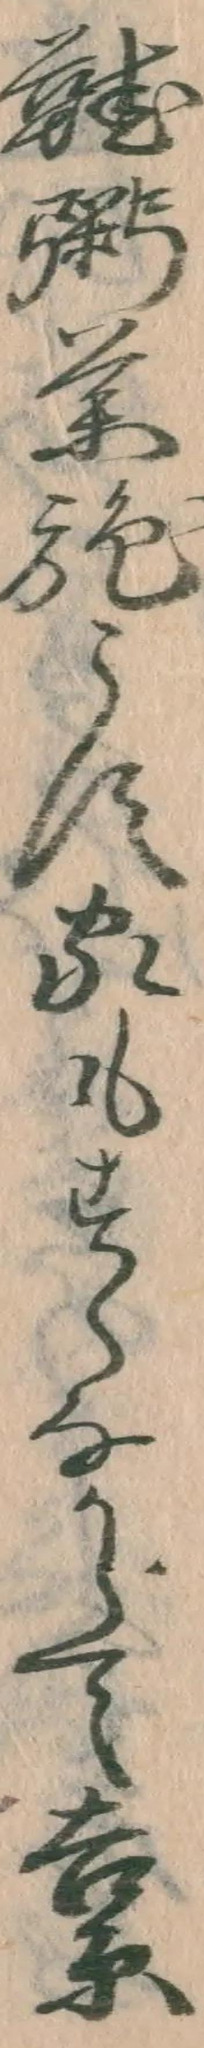鞋粥薬施こす家もすくなからて吉原
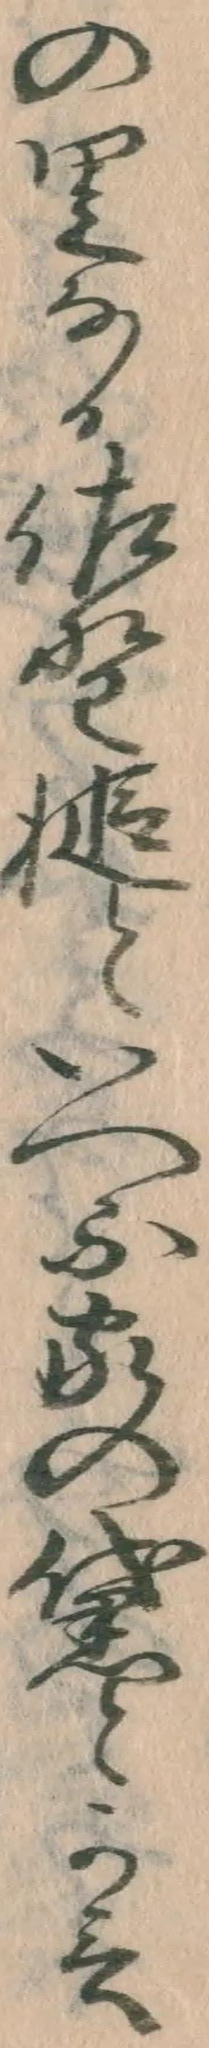の里なる佐野槌といへる家の黛とか云
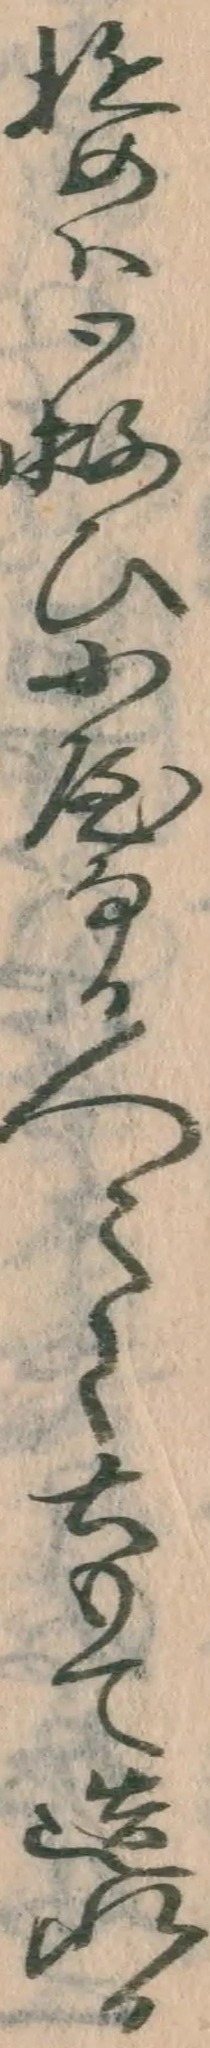遊めハ救ひ小屋なる人々に土もて造れる
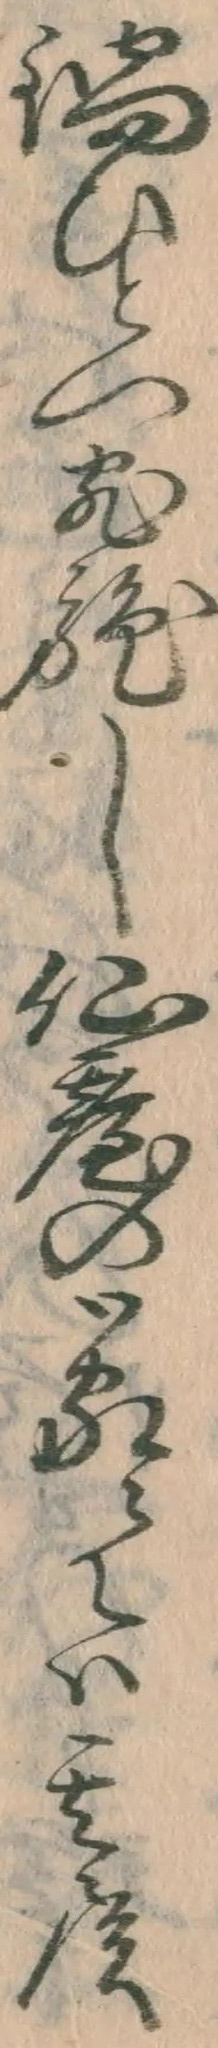鍋ひとつ宛施し仙臺の御家ニてハ其屋
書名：麗斎叢書. 20
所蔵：国立国会図書館 National Diet Library, JAPAN
